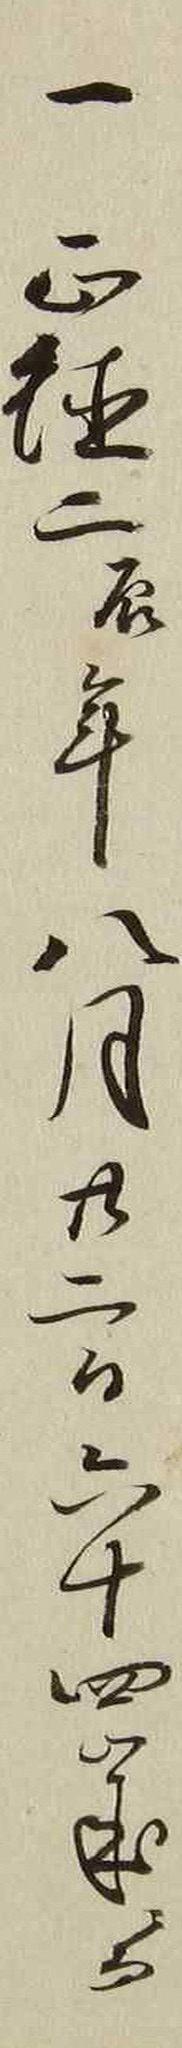一正徳二辰年八月廿二日六十四歳ニ而
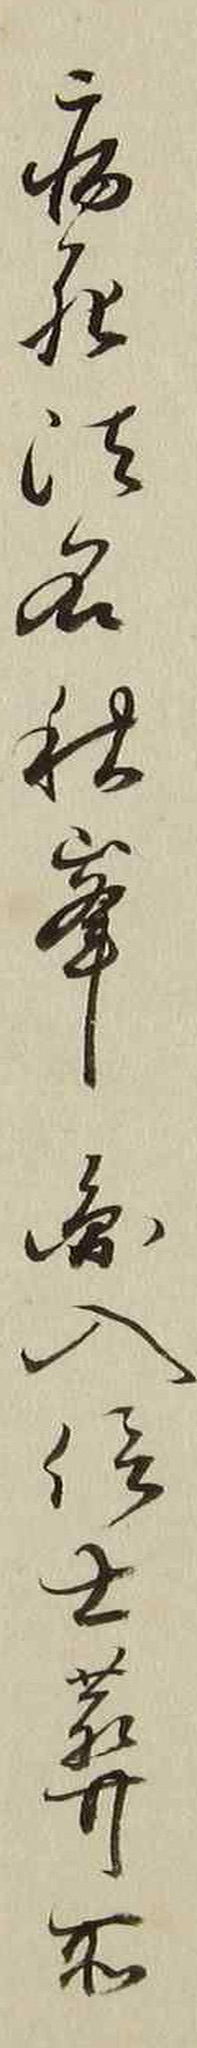病死法名秋峯圓入信士葬所
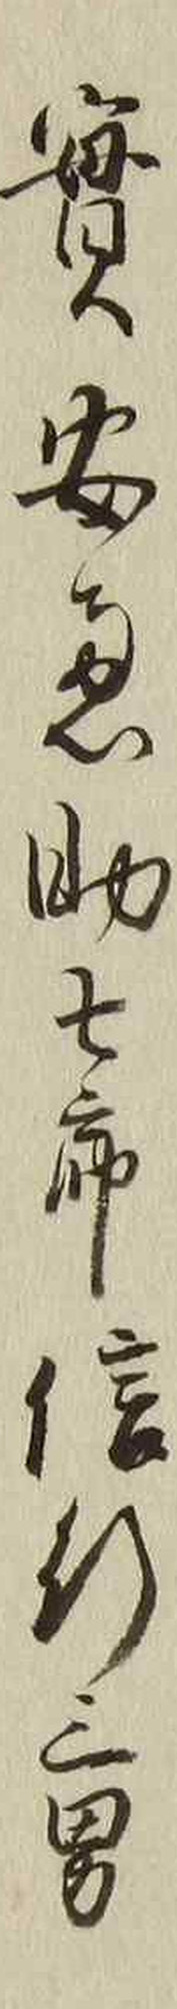実安恵助七郎信行三男
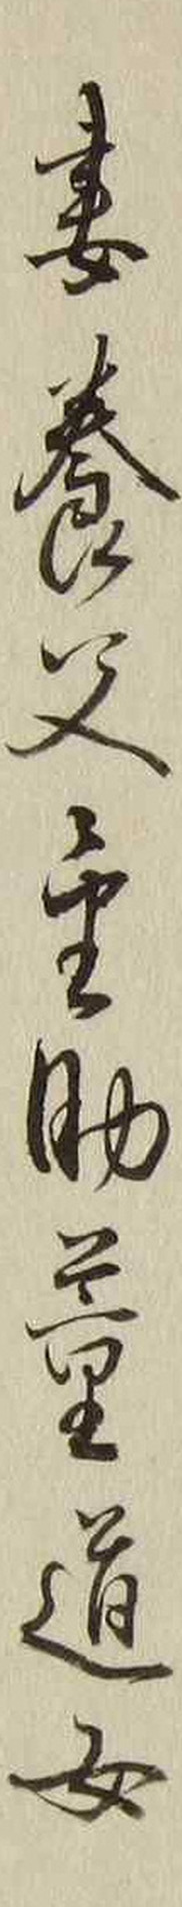妻養父金助董道女

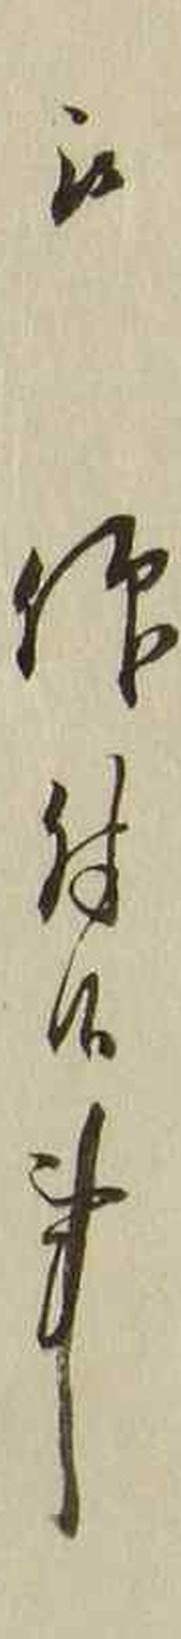被仰付候事
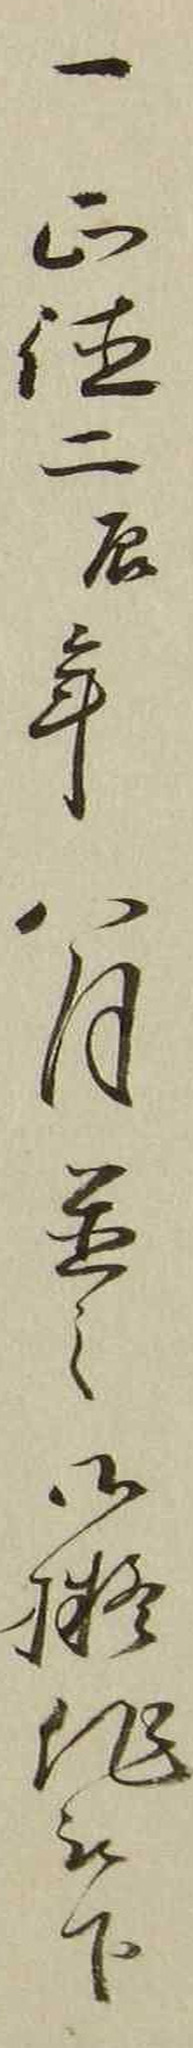一正徳二辰年八月並之御擬作被下
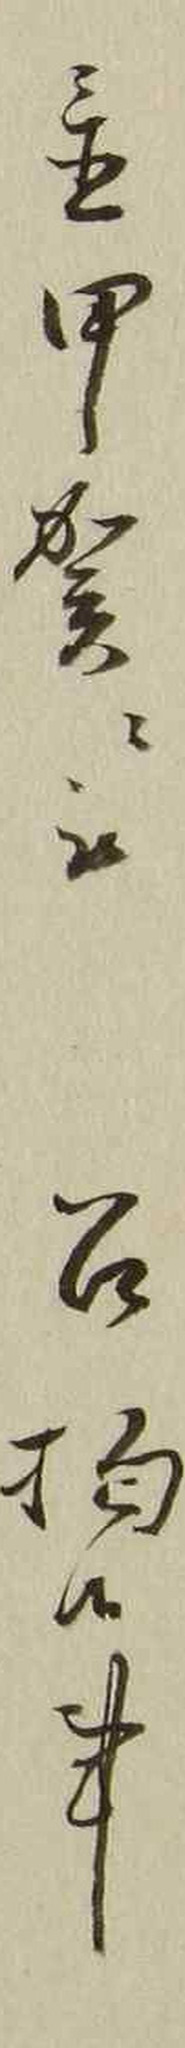置甲賀ニ被召抱候事
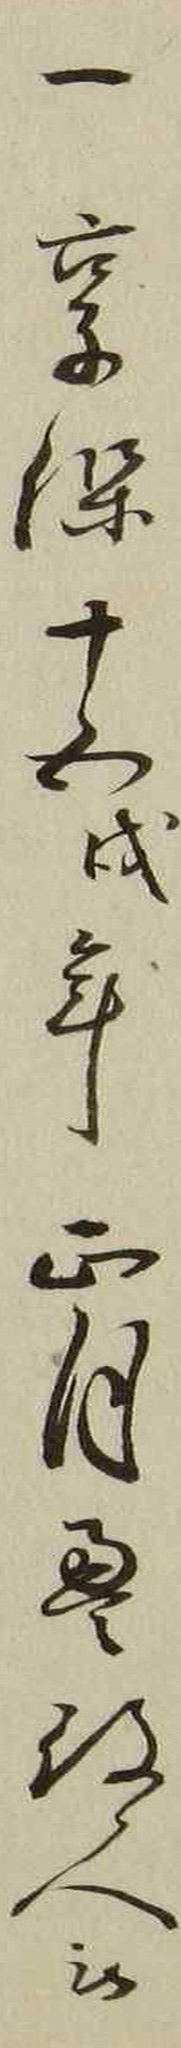一享保十五戌年正月畳役人被
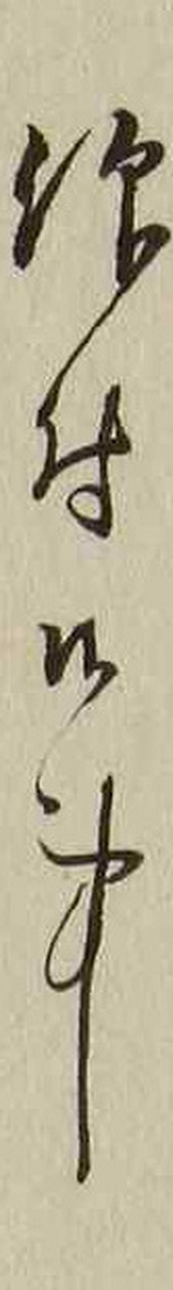仰付候事
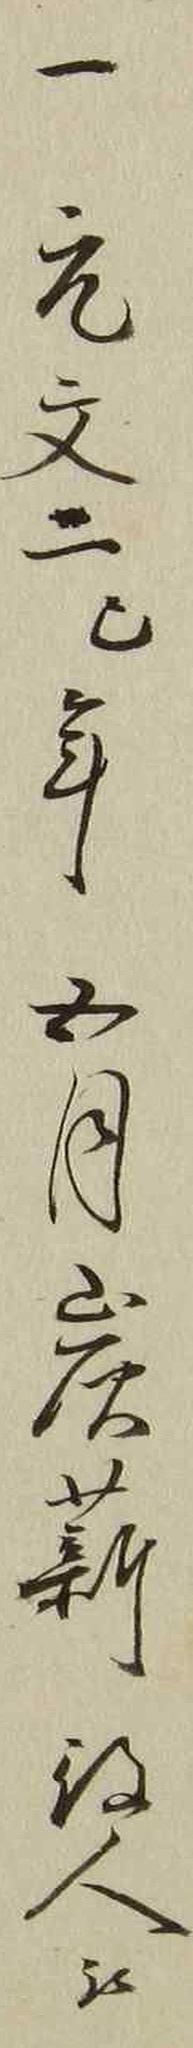一元文二巳年五月炭薪役人被
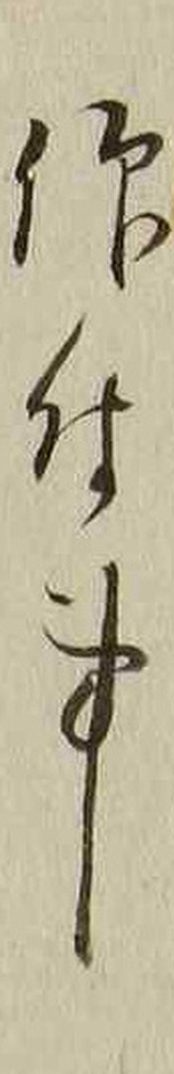仰付事
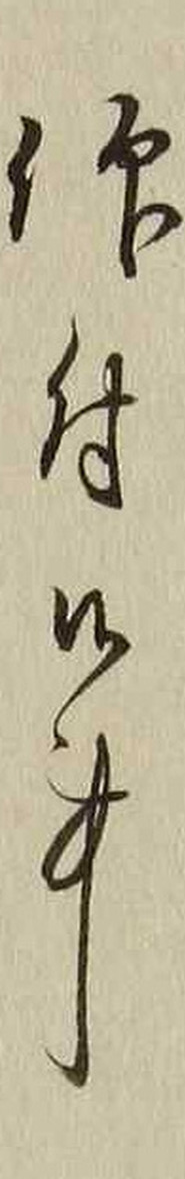仰付候事
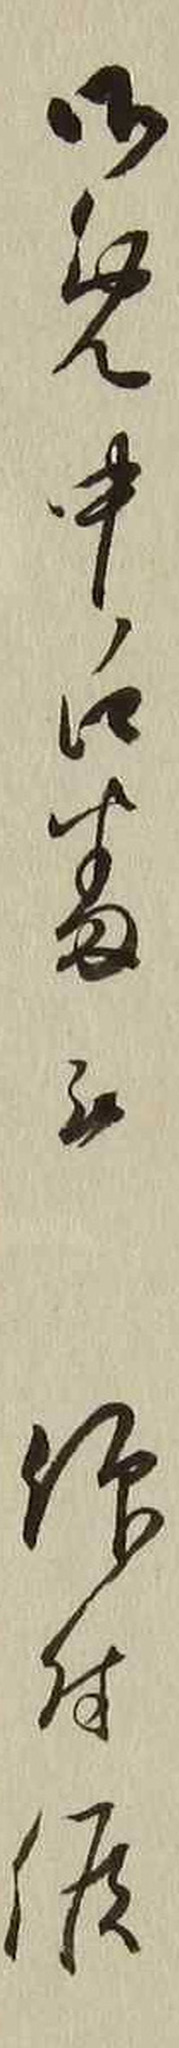御免中ノ口番被仰付候
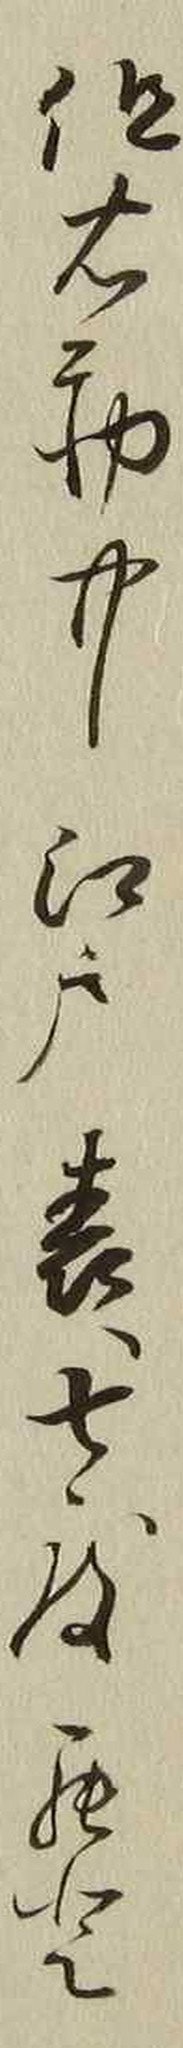但右勤中江戸表へ七度罷登
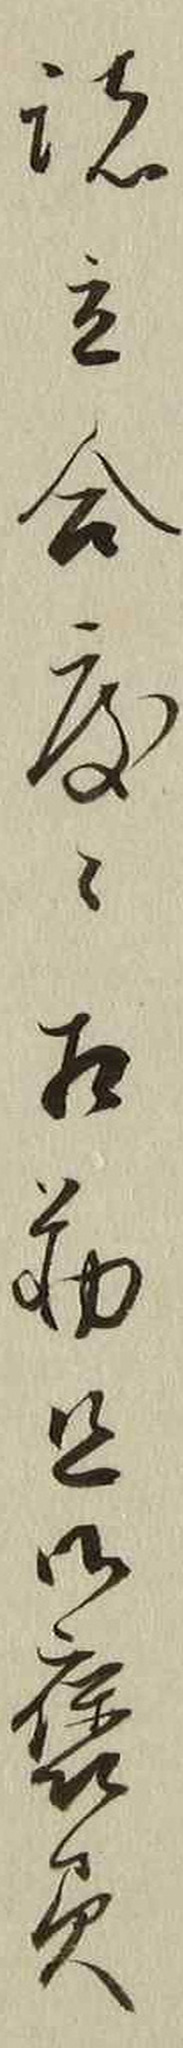諸立合度々相勤且御褒美
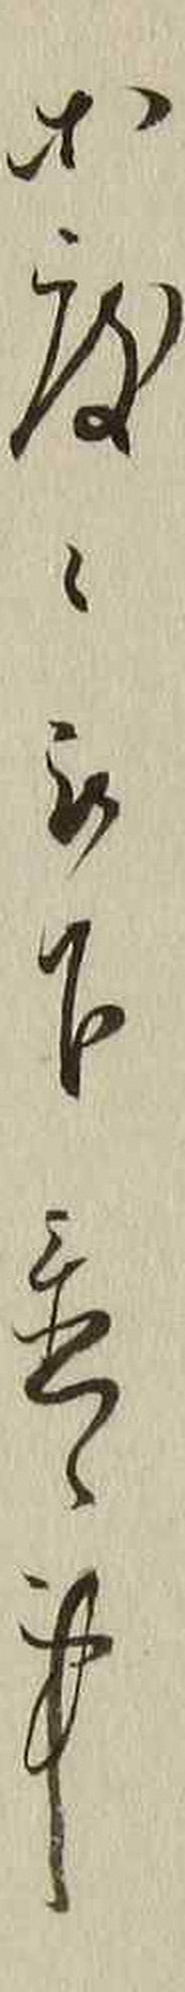等度々被下置候事
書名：諸士系譜　巻之52　に之部3
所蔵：会津若松市立会津図書館
